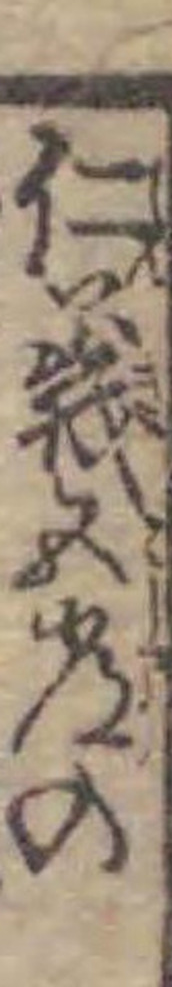仁義五常の
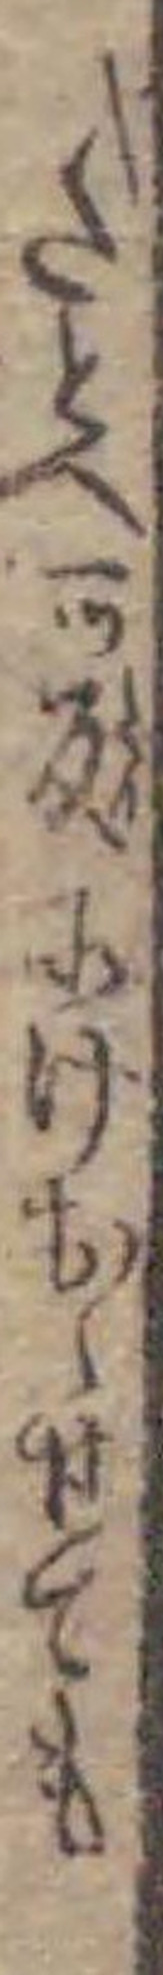〽たとへ一つ反にげおゝせても
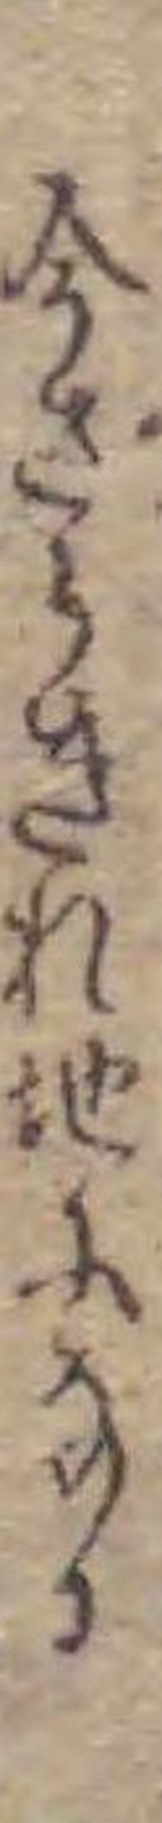いまさらきれ地になる
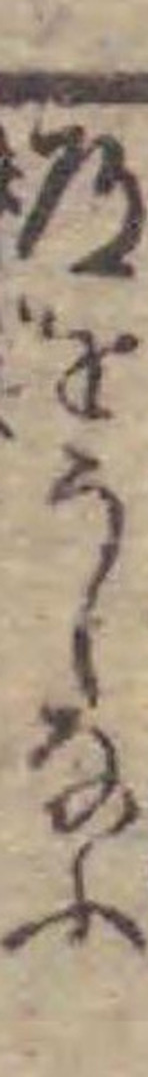道をうしなふ
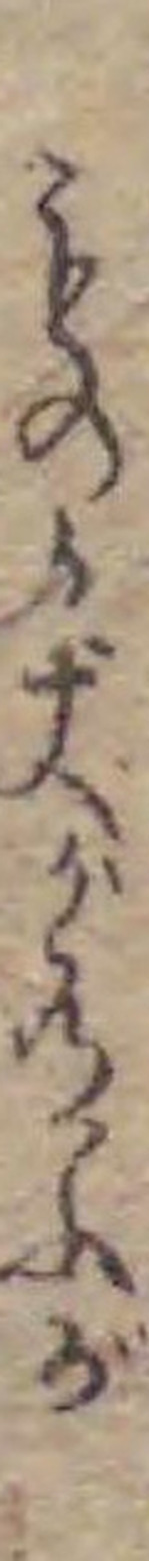ものか丈が有ふが
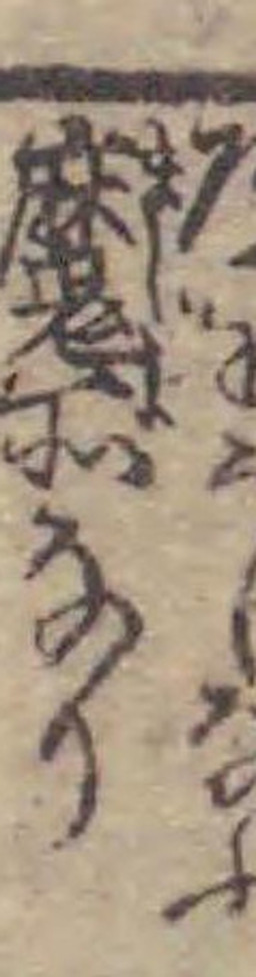魔所なり
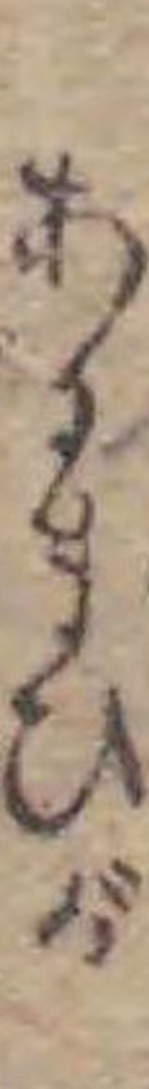あるまひが
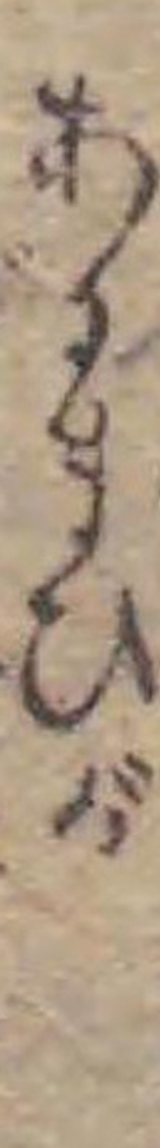あるまひが
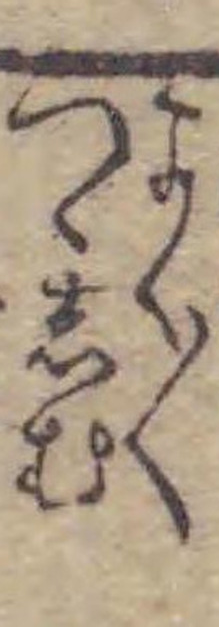つゝしむ
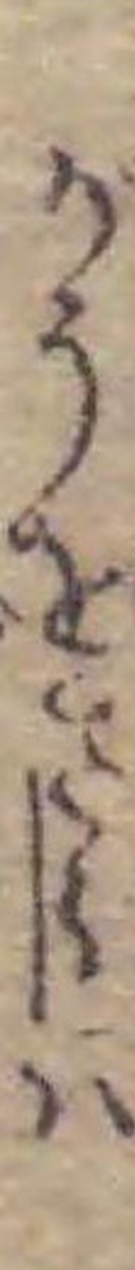がうをさらしは
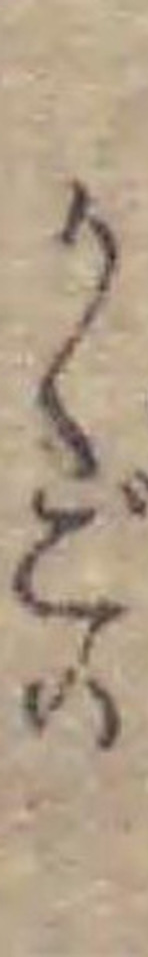かくごの
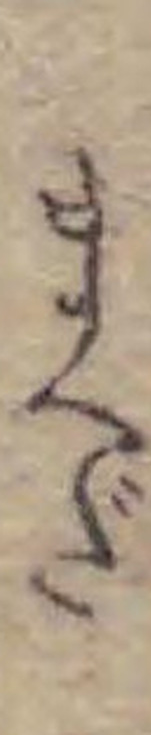まへだ
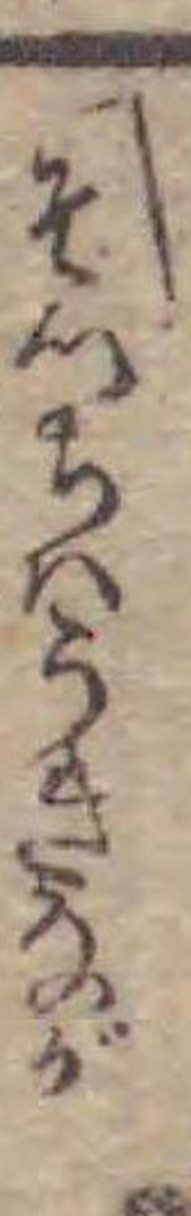〽そつちはうきなが
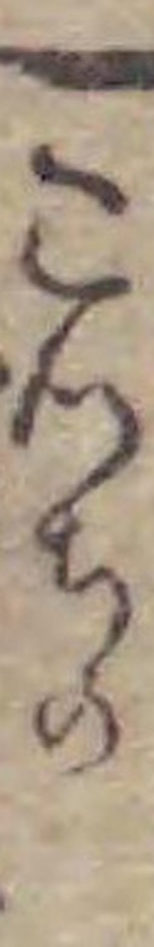こつちの
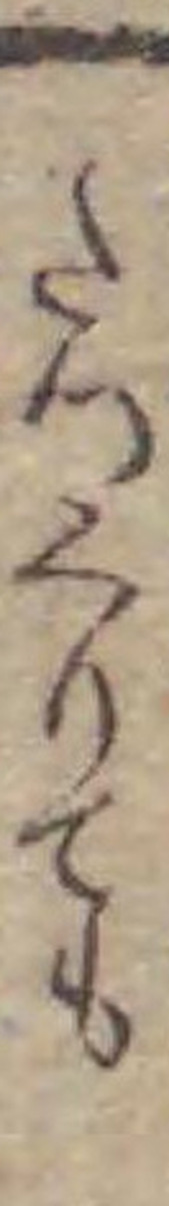たつくりても
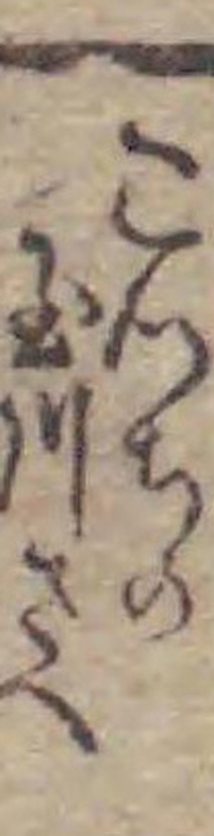玉川さへ
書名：北国順礼唄方便 : 3巻
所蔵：国立国会図書館 National Diet Library, JAPAN
